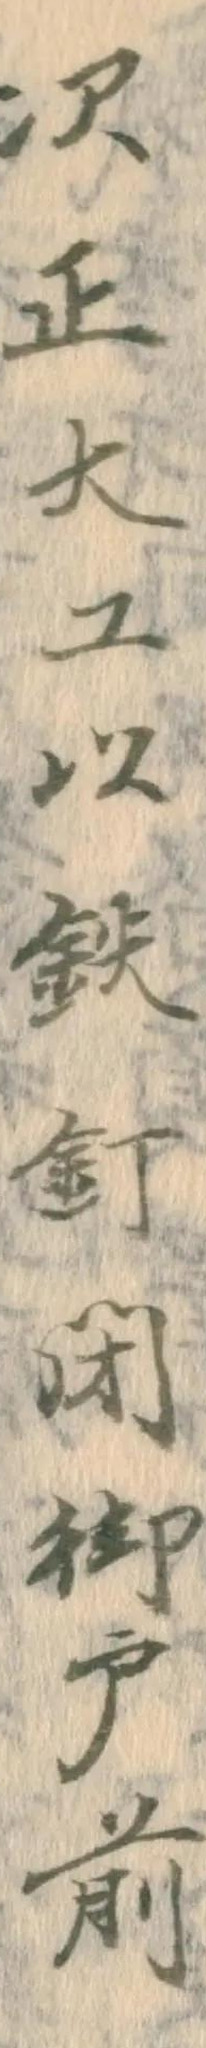次正大工以鉄釘閉御戸前
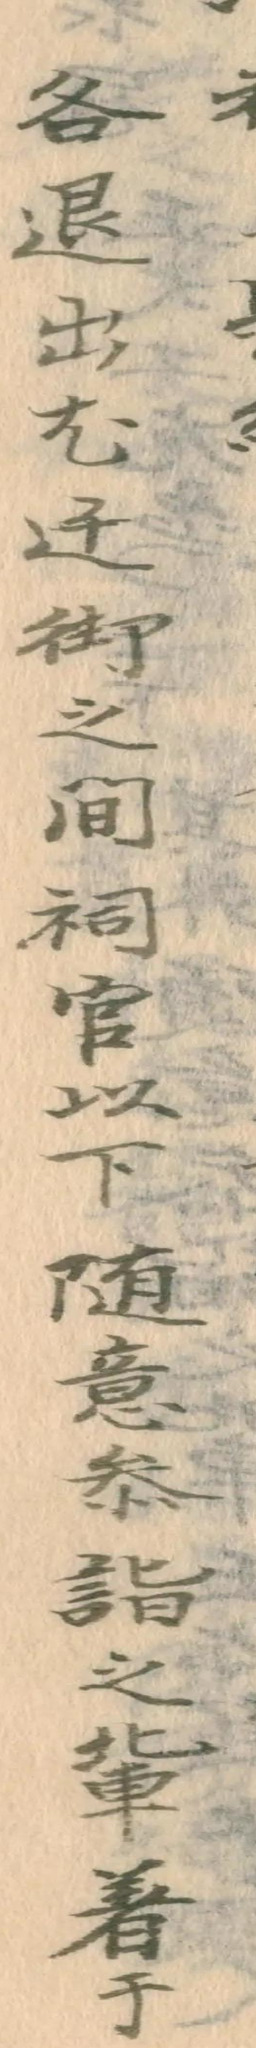各退出尤迁御之間祠官以下随意参詣之輩着于
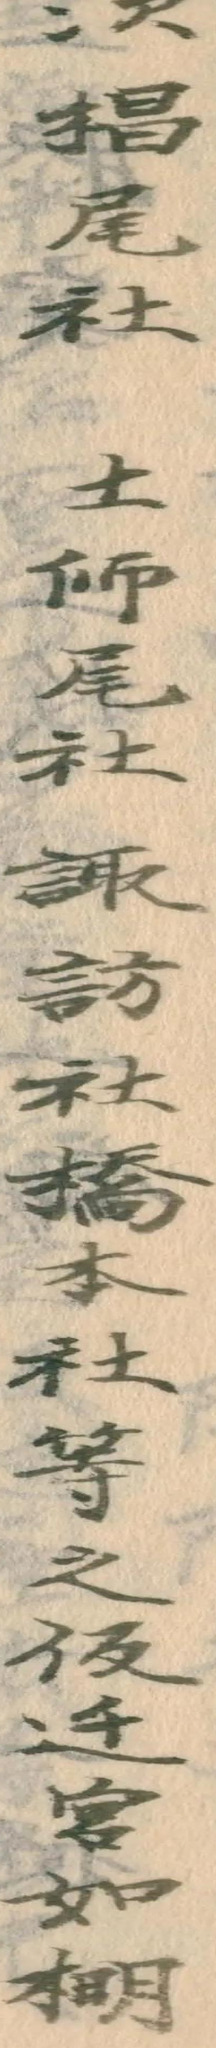次椙尾社土師尾社諏訪社橋本社等之仮迁宮如棚
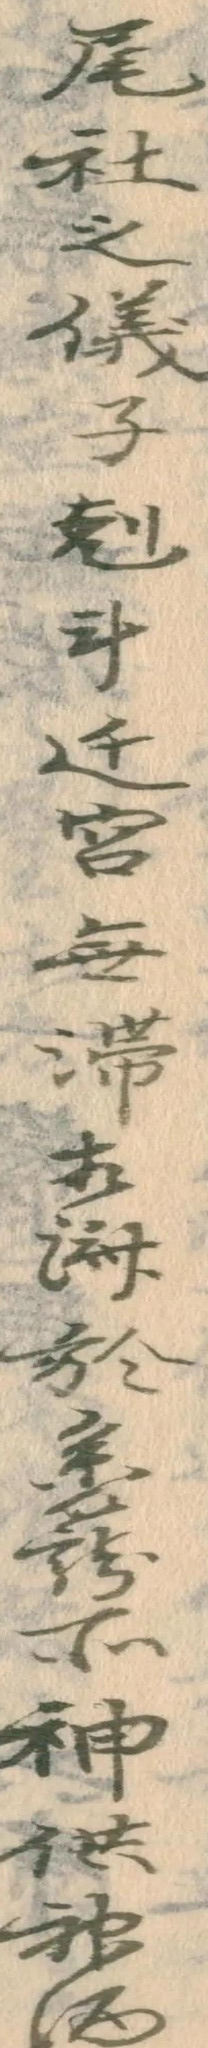尾社之儀子剋計迁宮無滞相済於参籠所神供神酒
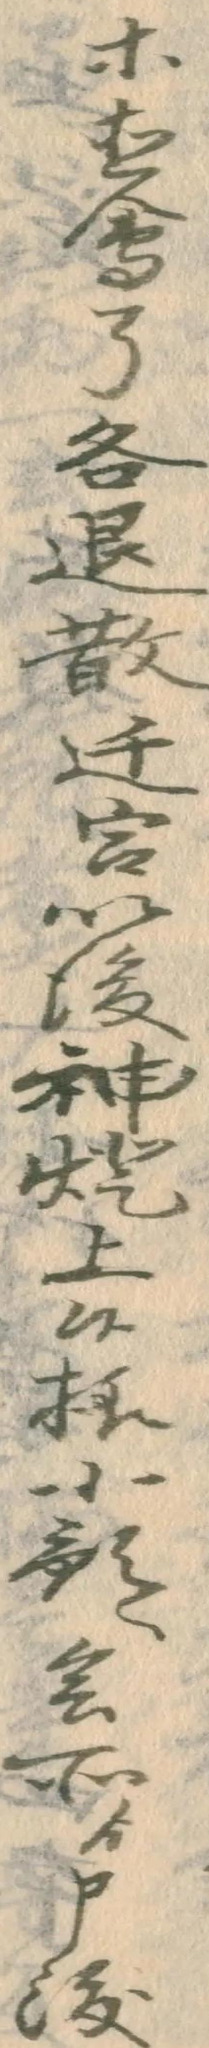等直会了各退散迁宮以後神燈上候様小預へ会所ゟ申渡
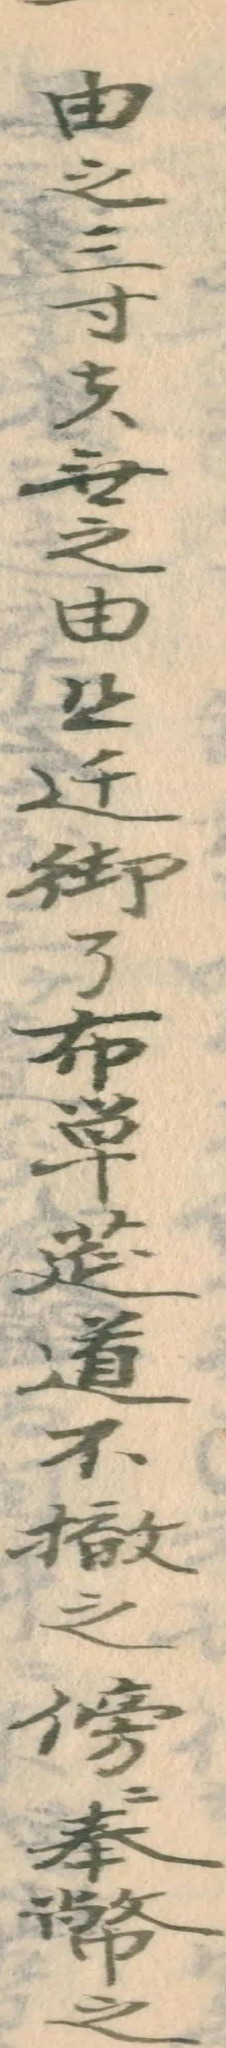一由之三寸は無之由且迁御了布単莚道不撤之傍ニ奉幣之
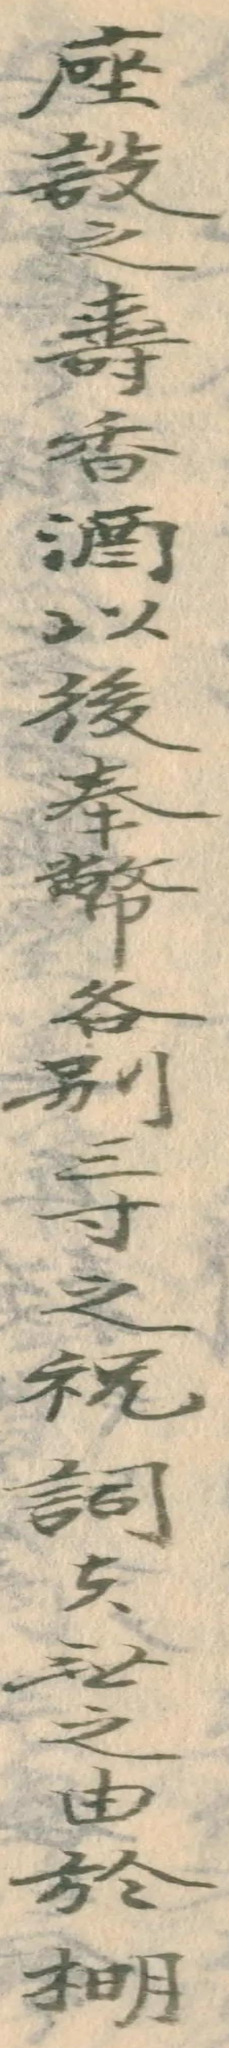座設之寿香酒以後奉幣各別三寸之祝詞は無之由於棚
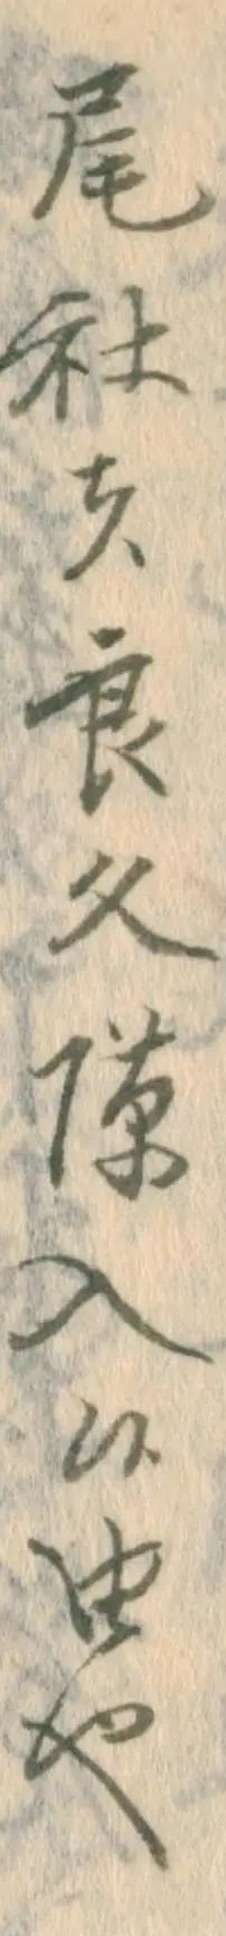尾社は良久陣入候由也
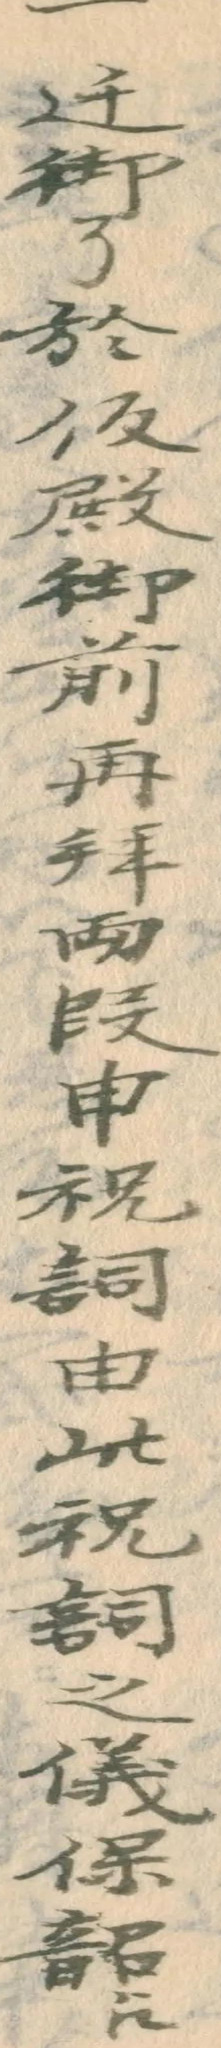一迁御了於仮殿御前再拝両段申祝詞由此祝詞之儀保韶江
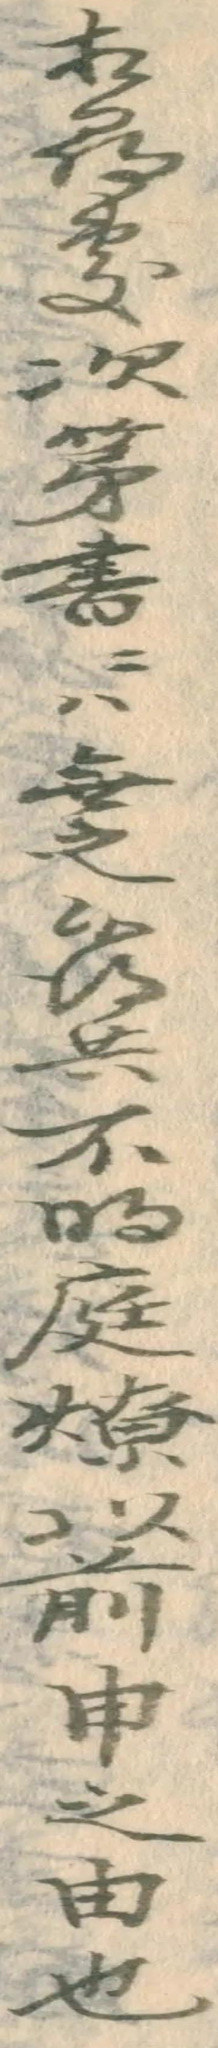相尋処次第書ニハ無之候得共不明庭燎以前申之由也
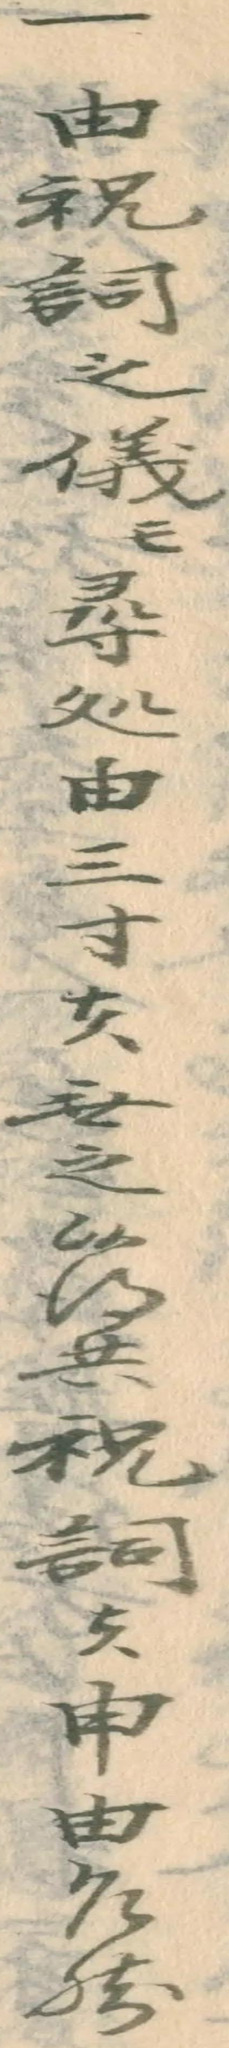一由祝詞之儀モ尋処由三寸は無之候得共祝詞は申由乍然
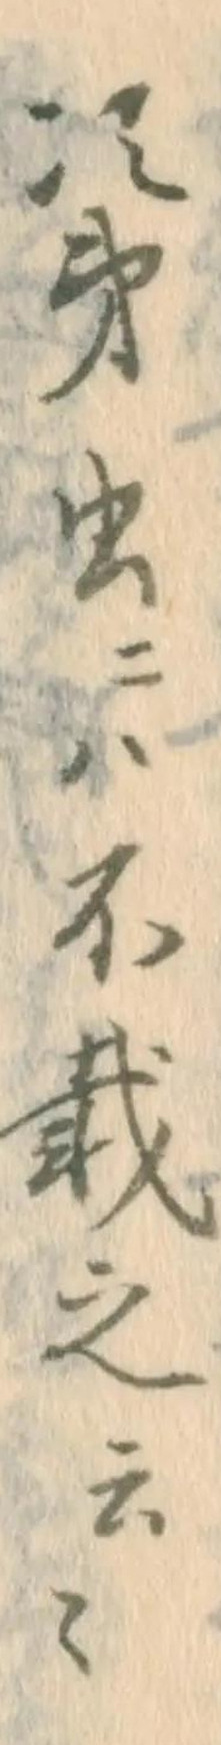次第書ニハ不戴之云々

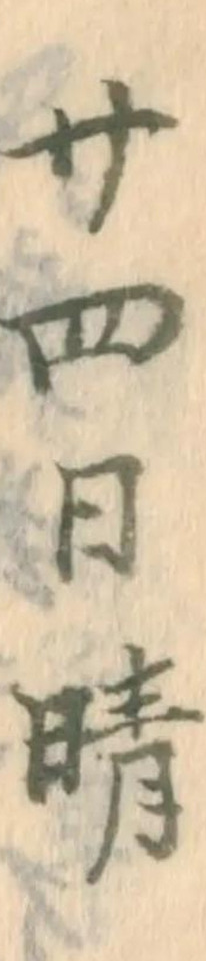廿四日朝
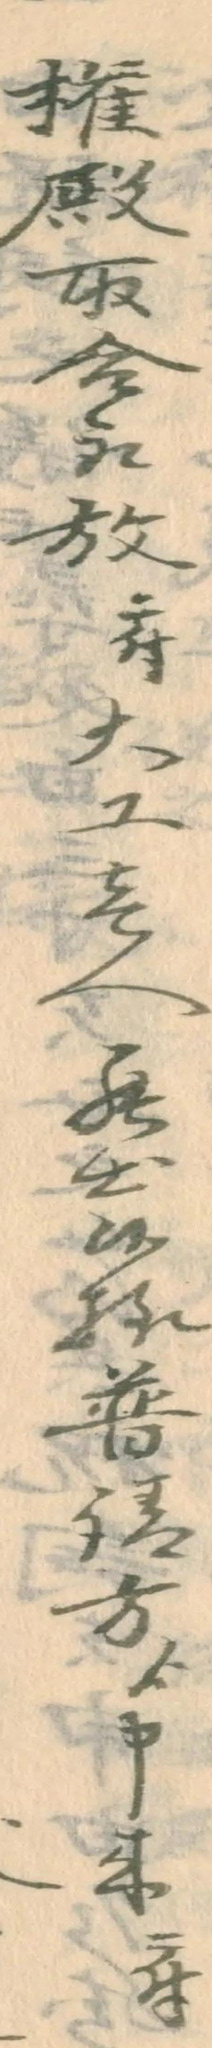一権殿取合取放ニ付大工壱人罷出候様普請方ゟ申来ニ付
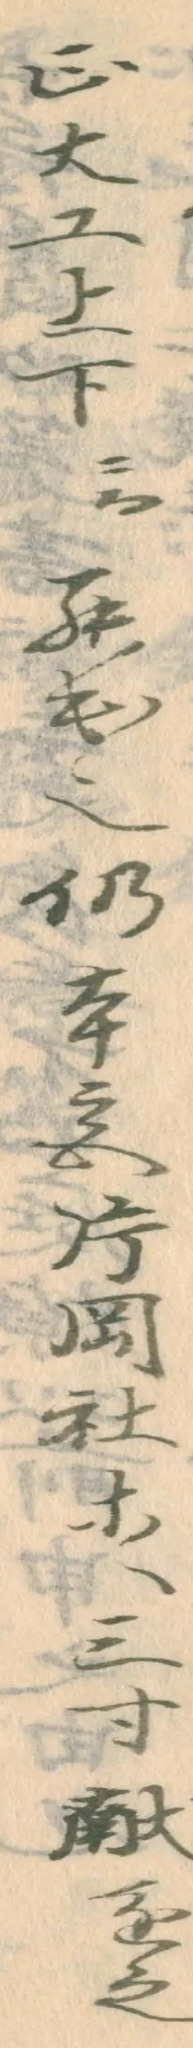正大工上下ニ而罷出也仍本宮片岡社等へ三寸献進之
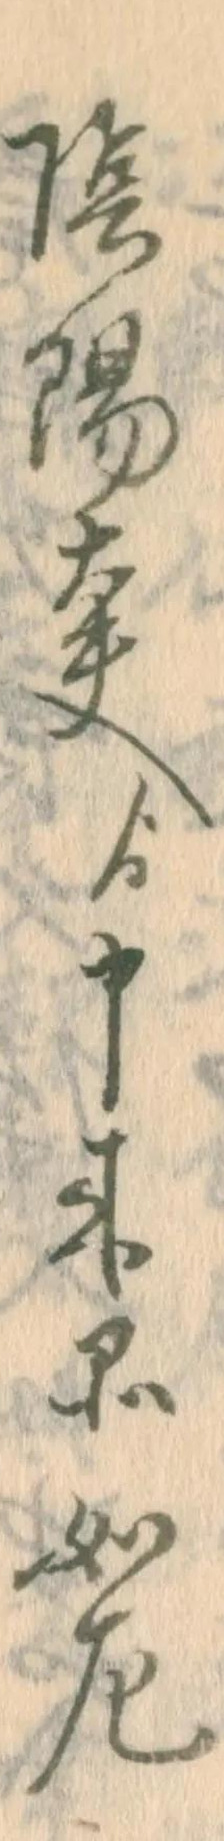一陰陽大夫ゟ申来品如左
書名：賀茂社記録. 第17冊
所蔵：国立国会図書館 National Diet Library, JAPAN
